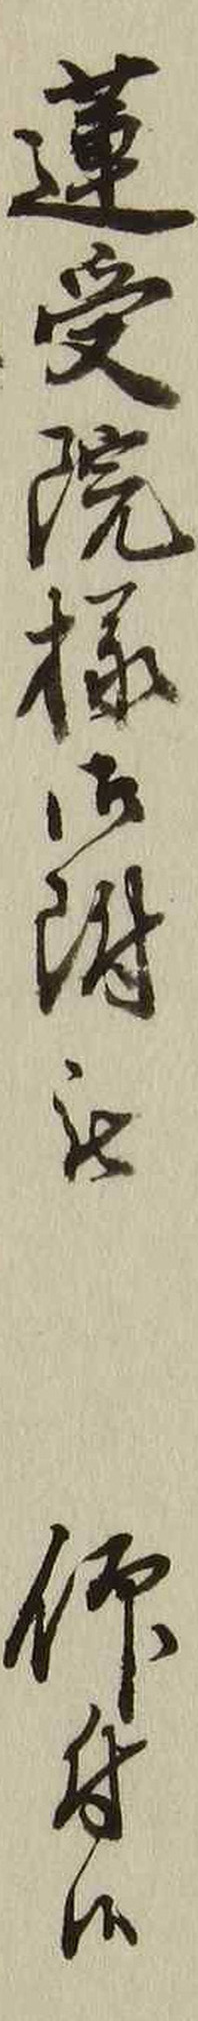蓮受院様御附被仰付候
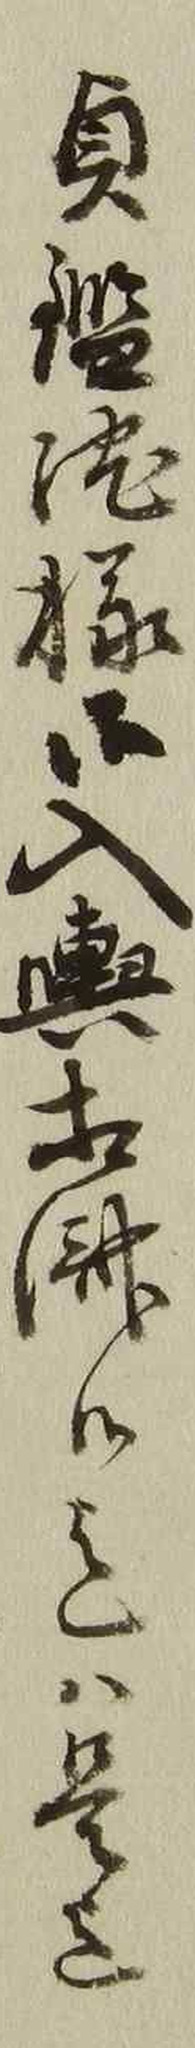貞鑑院様御入輿相済候迄ハ是迄
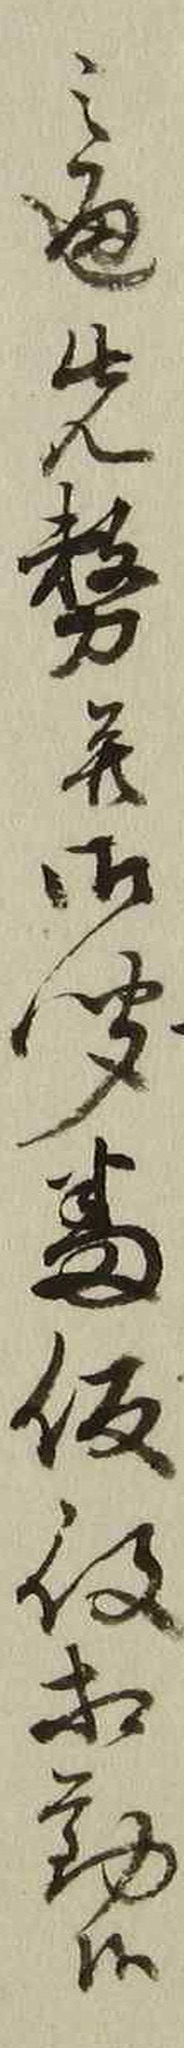之通先務并御聞番仮役相勤候
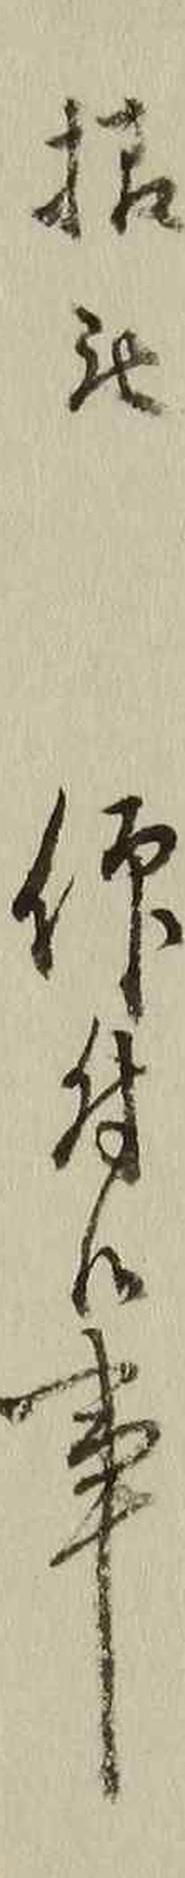様被仰付候事
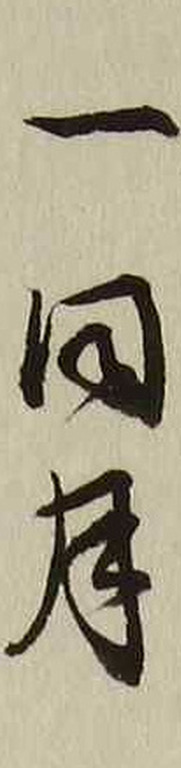一同月
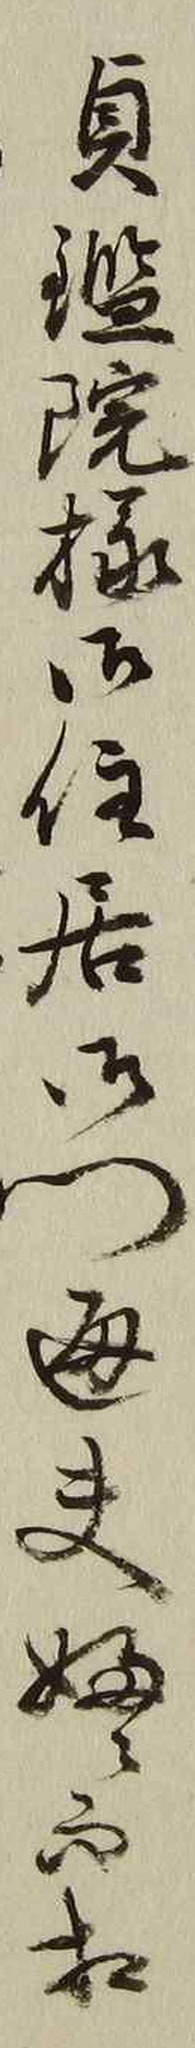貞鑑院様御住居御門通夫婦ニ而相
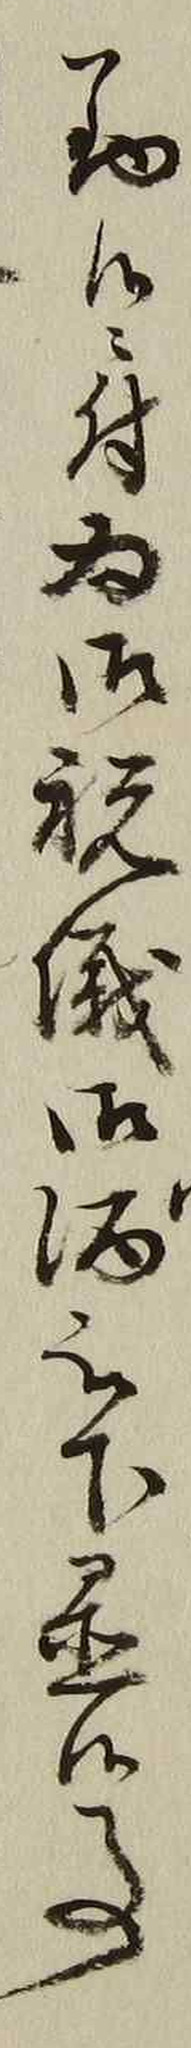勤候ニ付為御祝儀御酒被下置候事
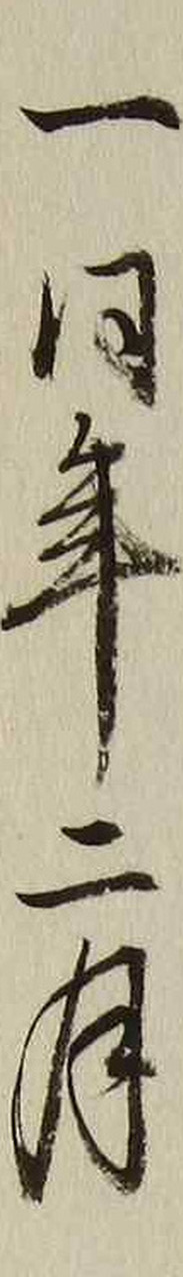一同年二月
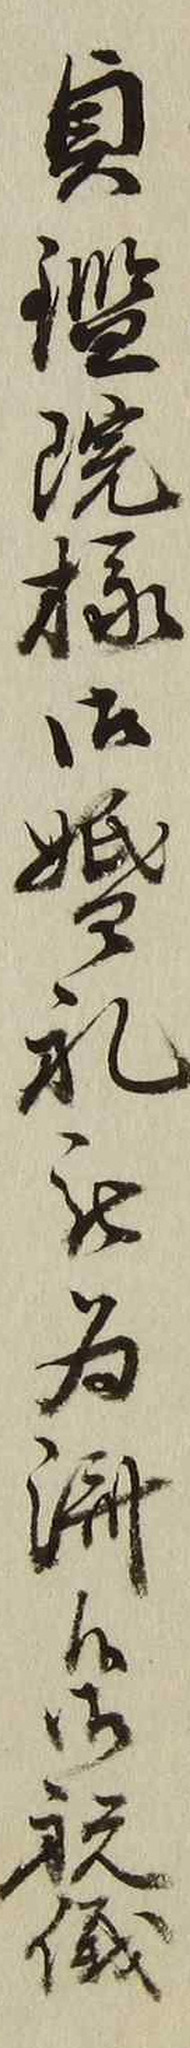貞鑑院様御婚礼被為済候御祝儀
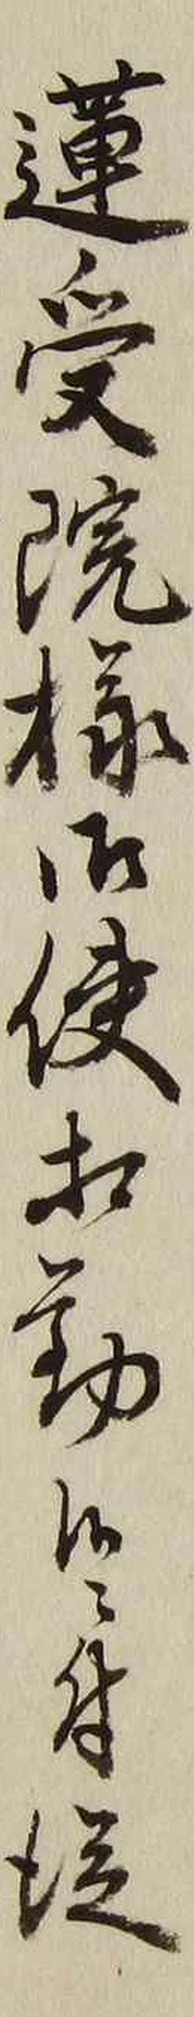蓮受院様御使相勤候ニ付従
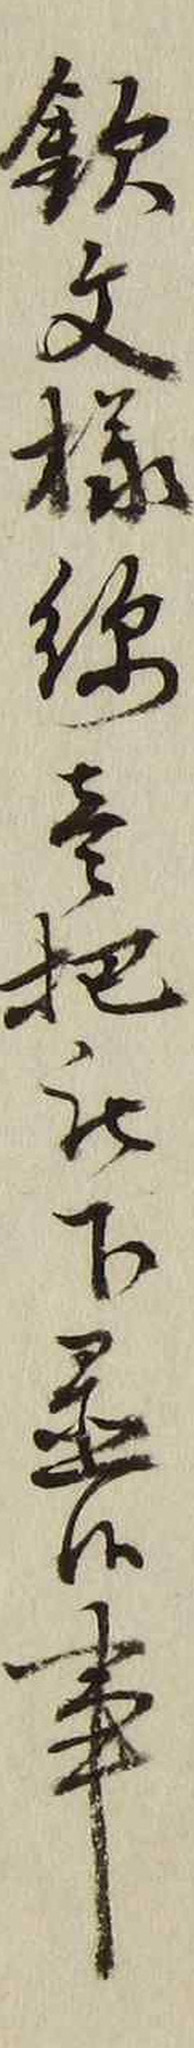欽文様綿壱把被下置候事
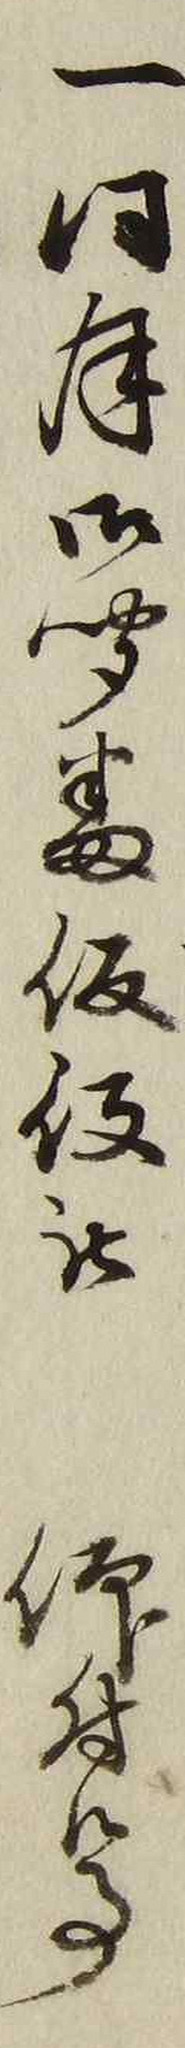一同月御聞番仮役被仰付候事
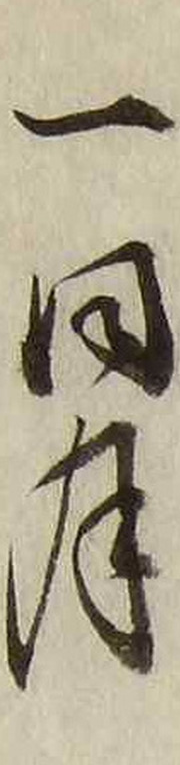一同月

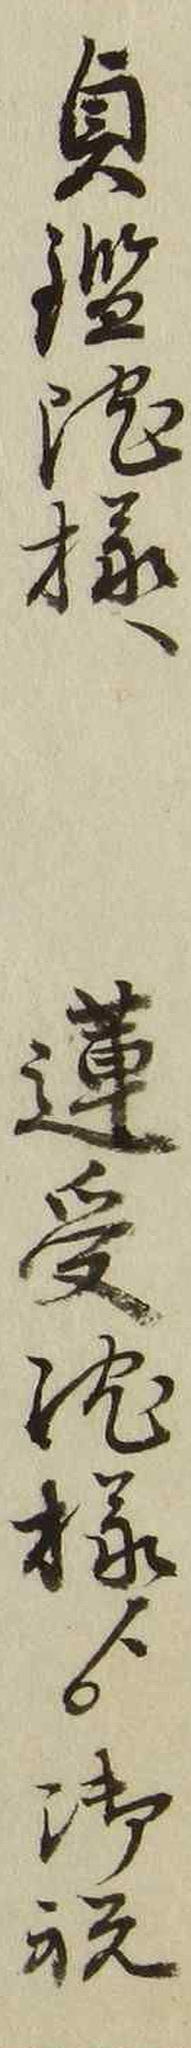貞鑑院様へ蓮受院様ゟ御祝
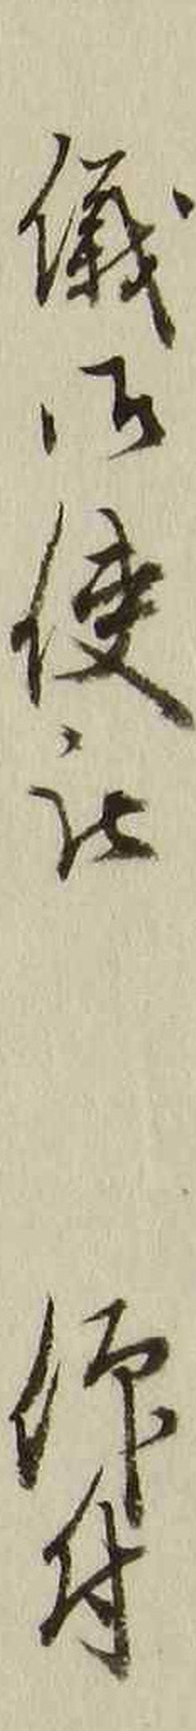儀御使被仰付
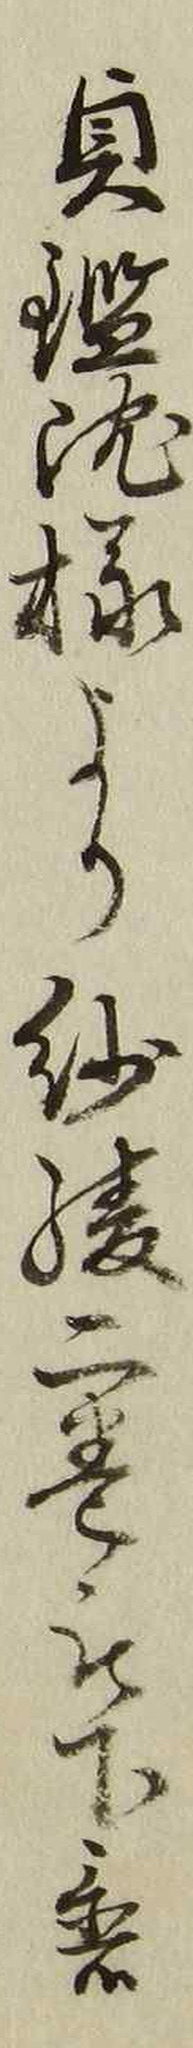貞鑑院様より紗綾二巻被下置候
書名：諸士系譜　巻之35　は之部3
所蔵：会津若松市立会津図書館
